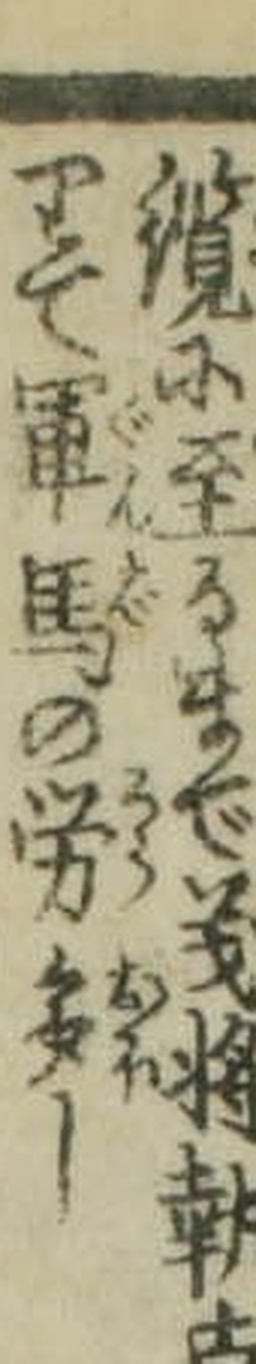りて軍馬の労多し
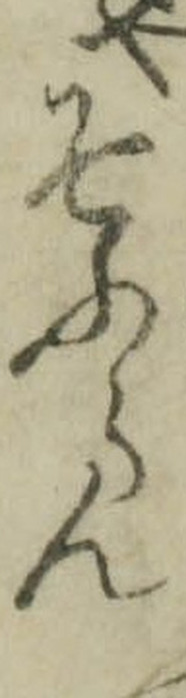そふらん
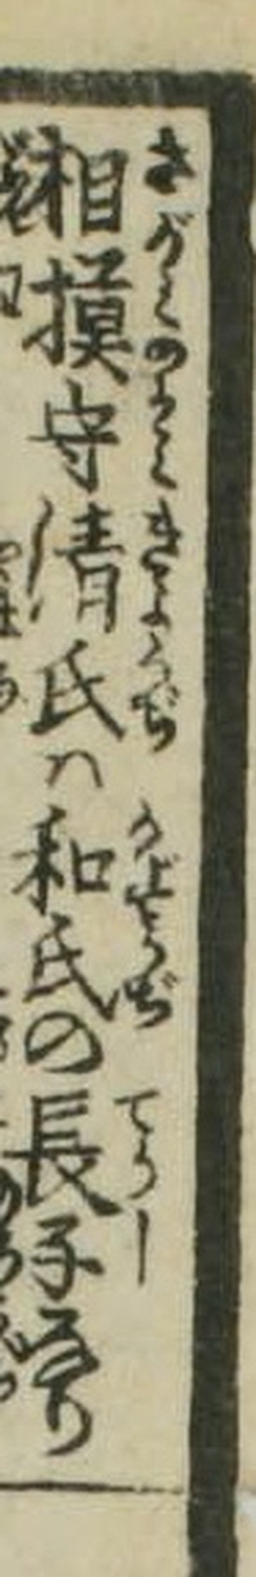相模守清氏は和氏の長子なり
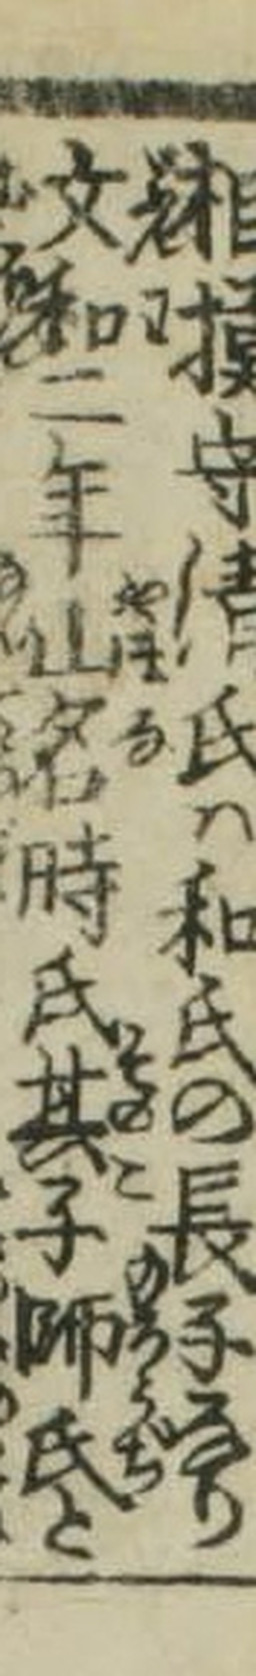文和二年山名時氏其子師氏と
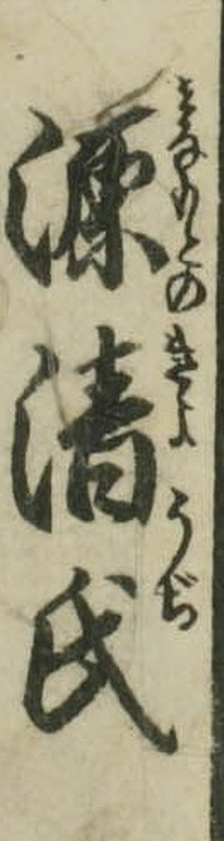源清氏
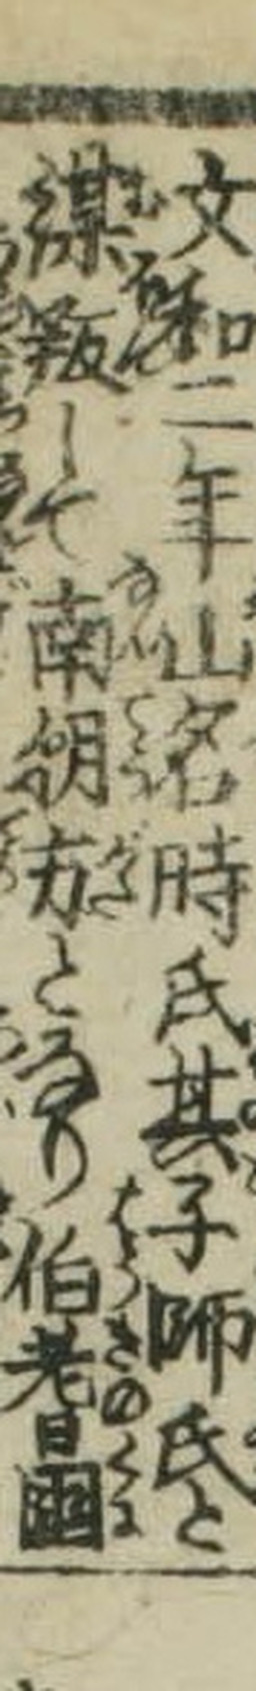謀反して南朝方となり伯耆國
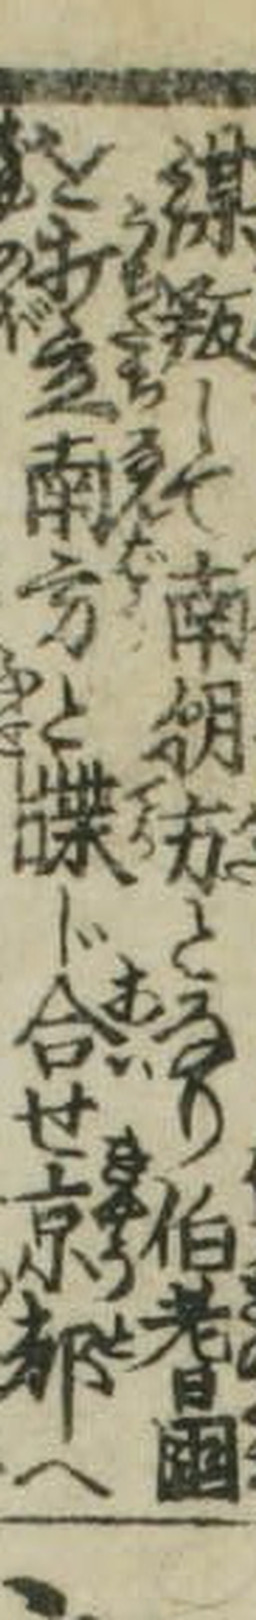を打立南方と諜じ合せ京都へ
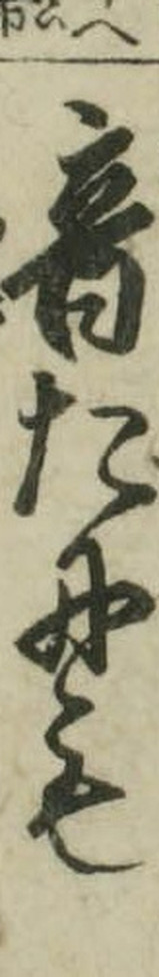音だにも
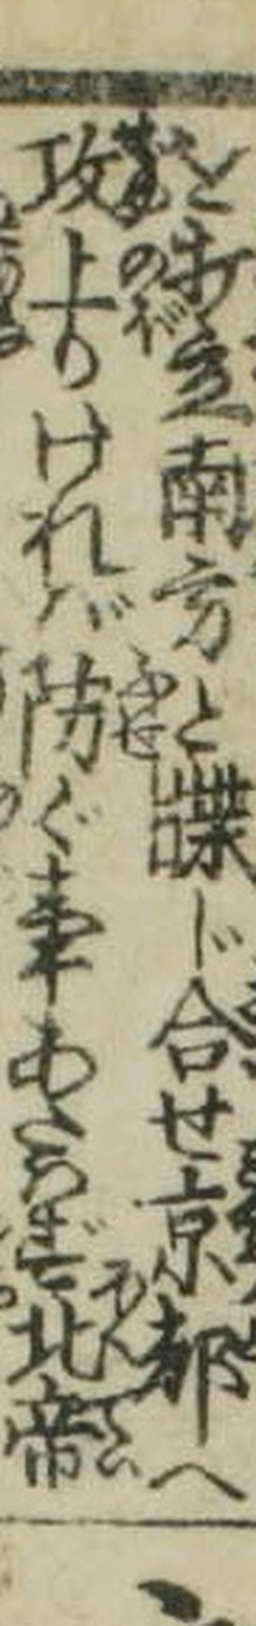攻上りければ防ぐ事あたはず北帝
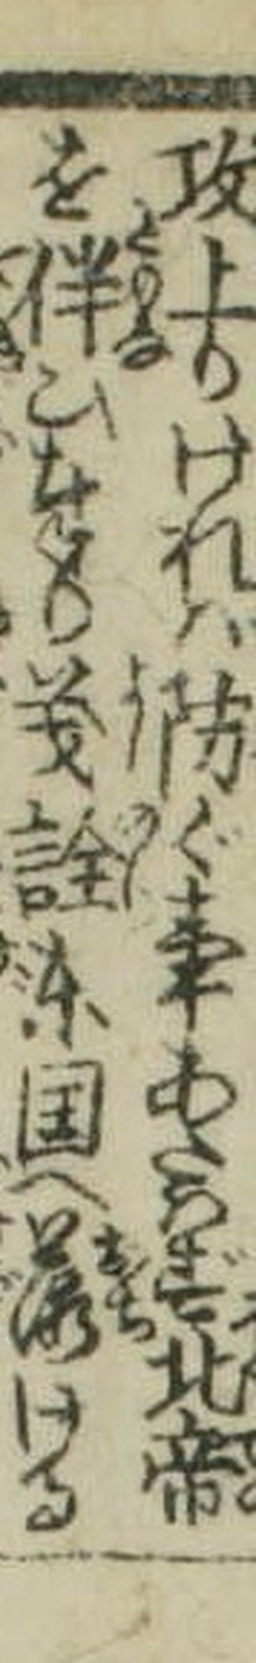を伴ひ奉り義詮東国へ落ける
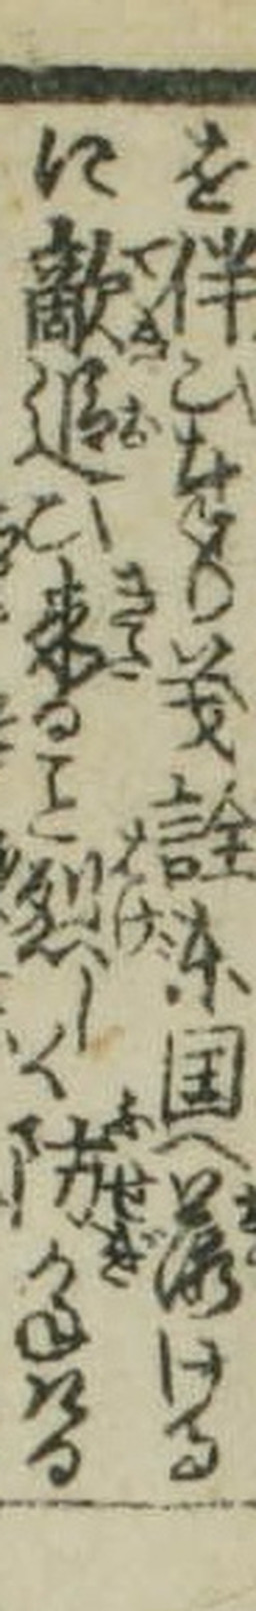に敵追ひ来ること烈しく防かねける
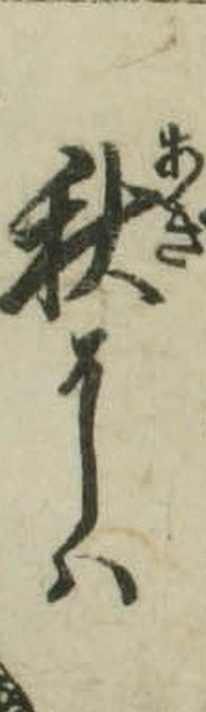秋には
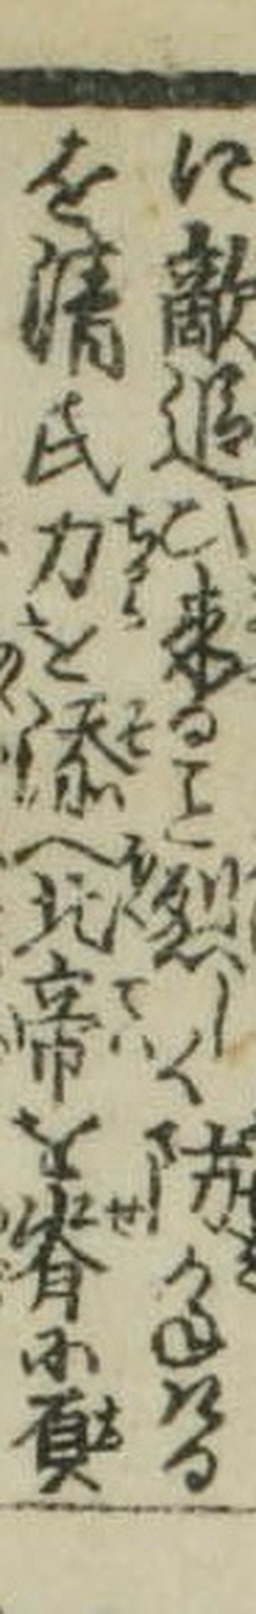を清氏力を添へ北帝を背に負
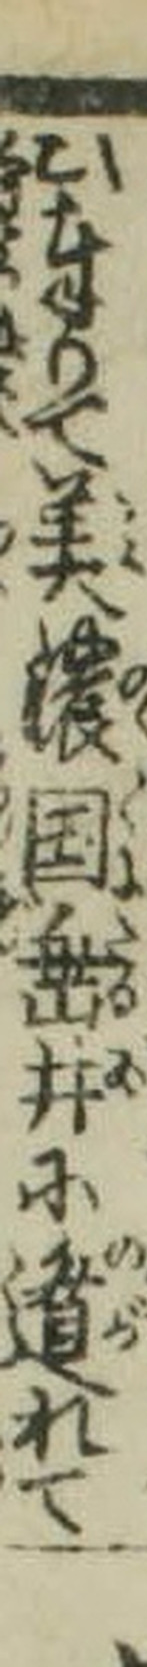ひ奉りて美濃国垂井に遁れて
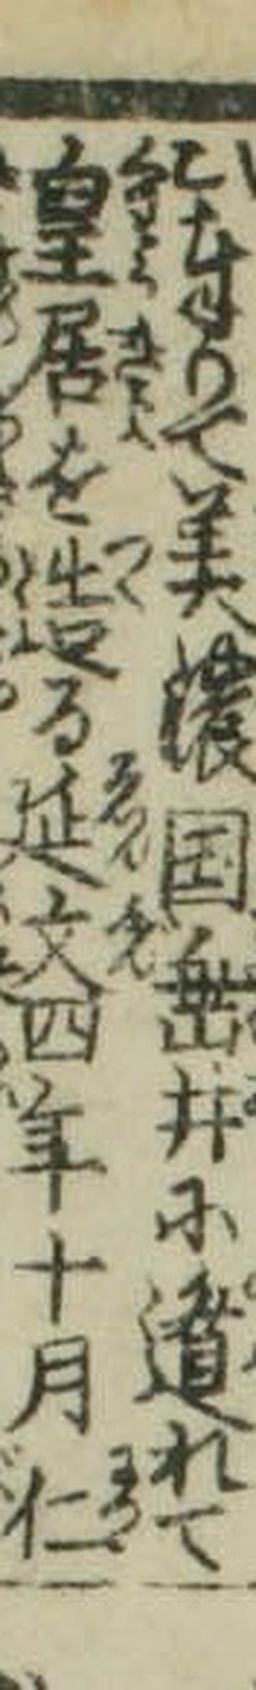皇居を造る延文四年十月仁
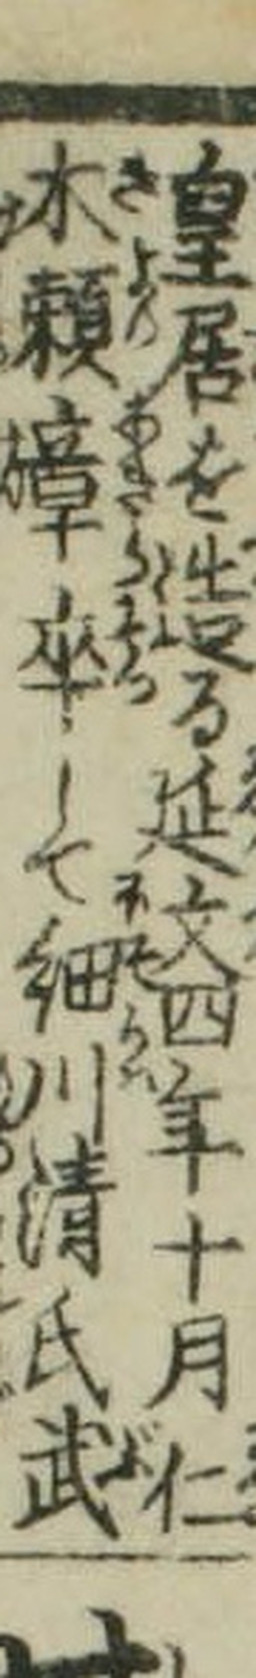木頼章卒して細川清氏武
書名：續英雄百人一首
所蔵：東京学芸大学附属図書館
